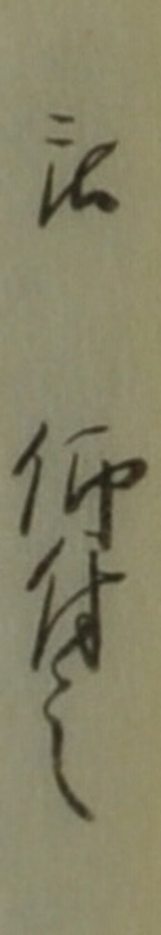被仰付之
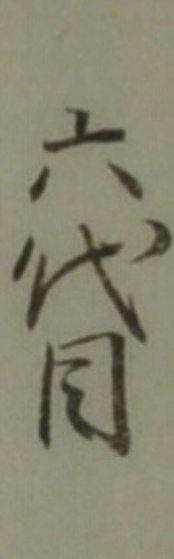六代目
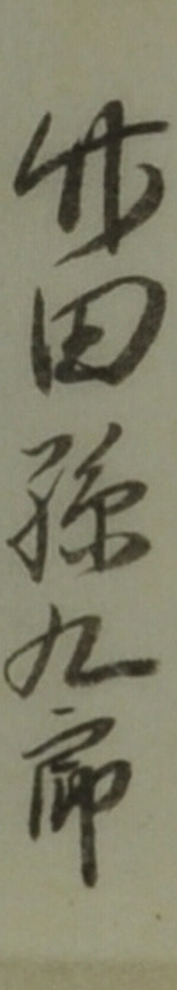竹田孫九郎
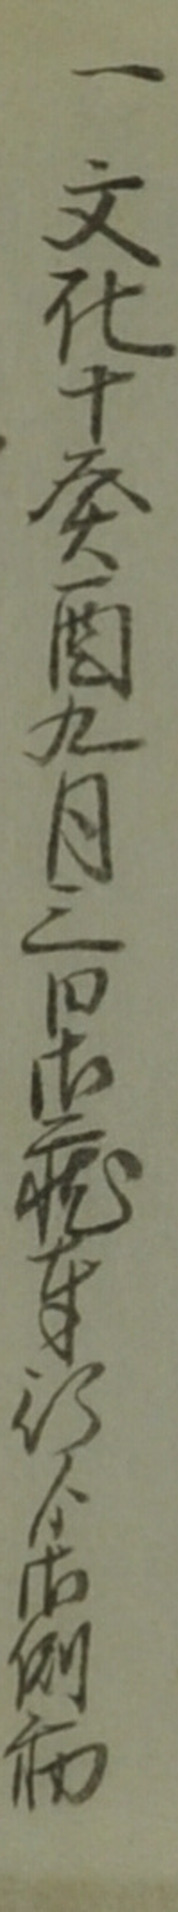一文化十癸酉九月三日御蔵奉行ゟ御側勤
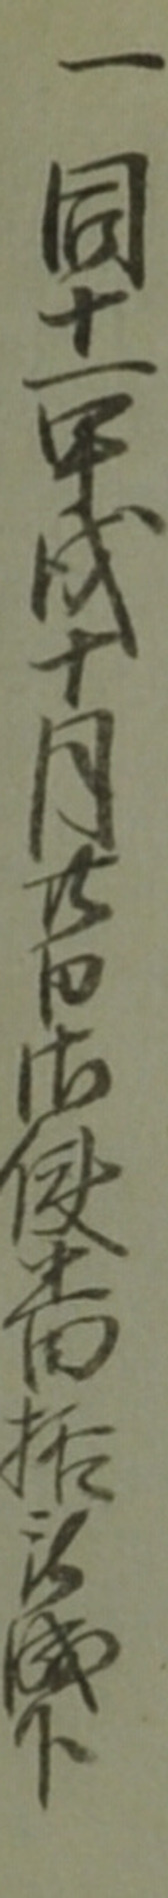一同十一甲戌十月廿日御使番格被成下
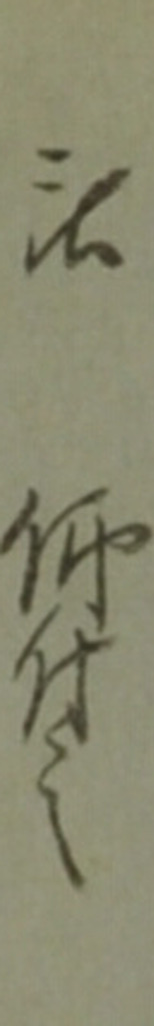被仰付之
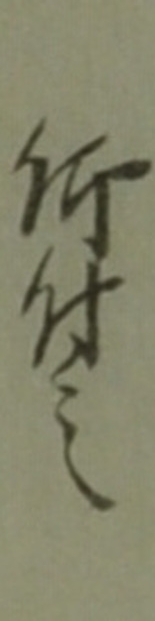仰付之
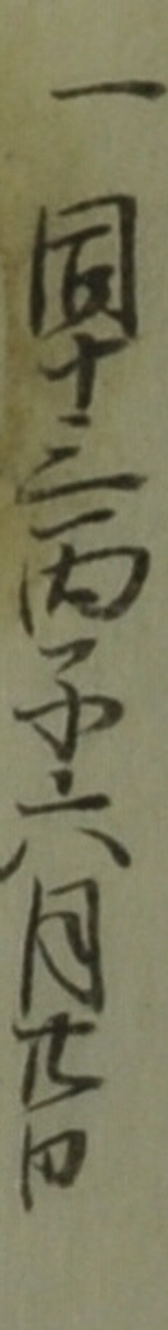一同十三丙子八月廿五日
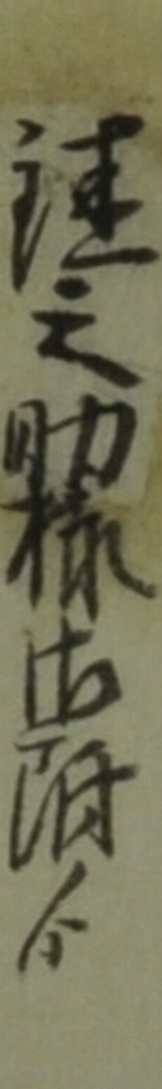銈之助様御附ゟ
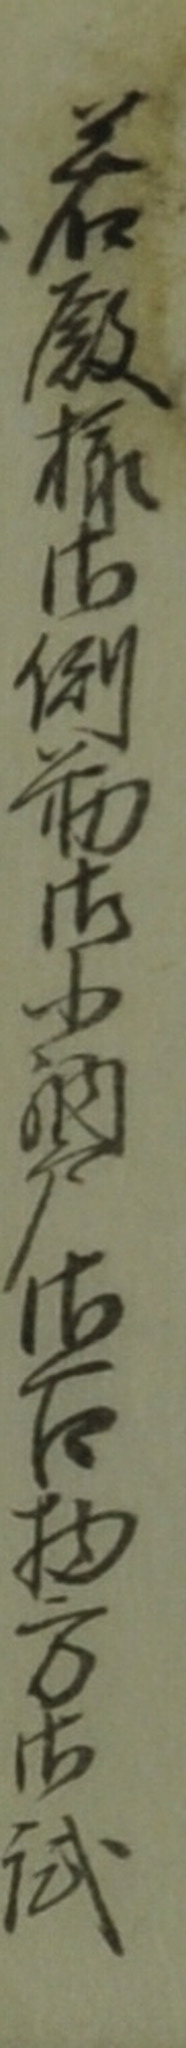若殿様御側勤御小納戸御召物方御試
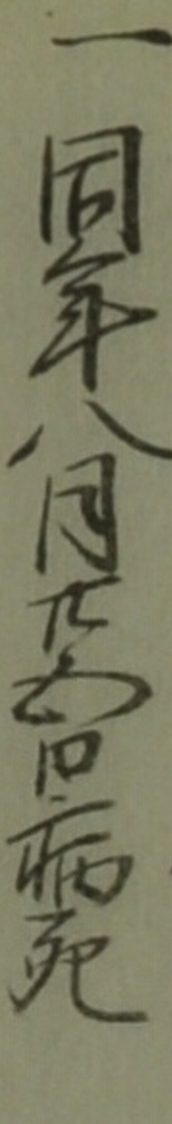一同年八月廿五日病死
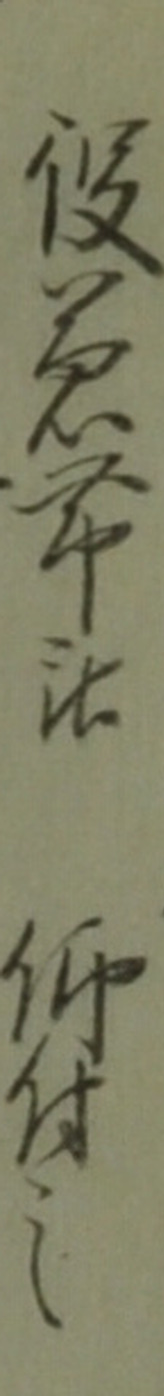役兼帯被仰付之
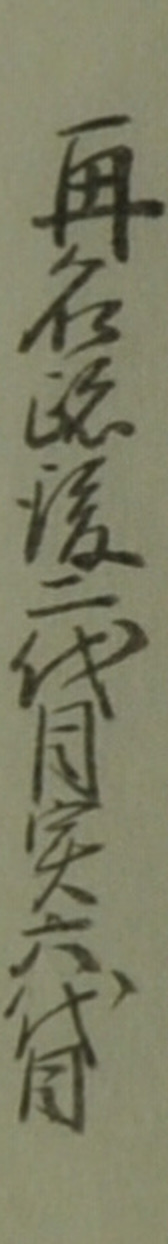再名跡後二代目実六代目
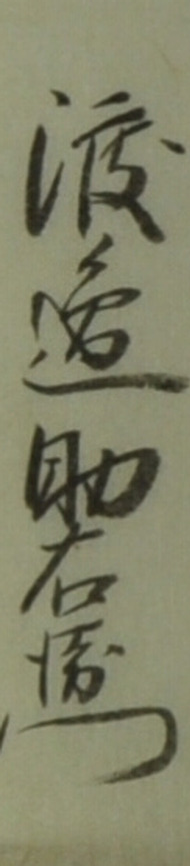渡辺助右衛門

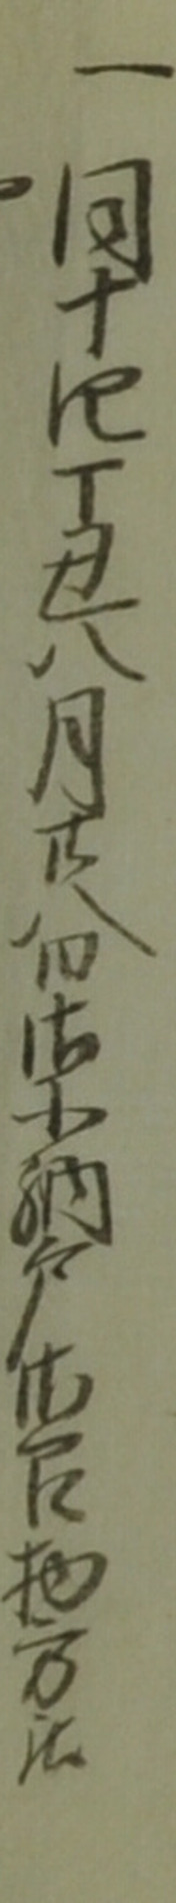一同十四丁丑八月廿八日御小納戸御召物方被
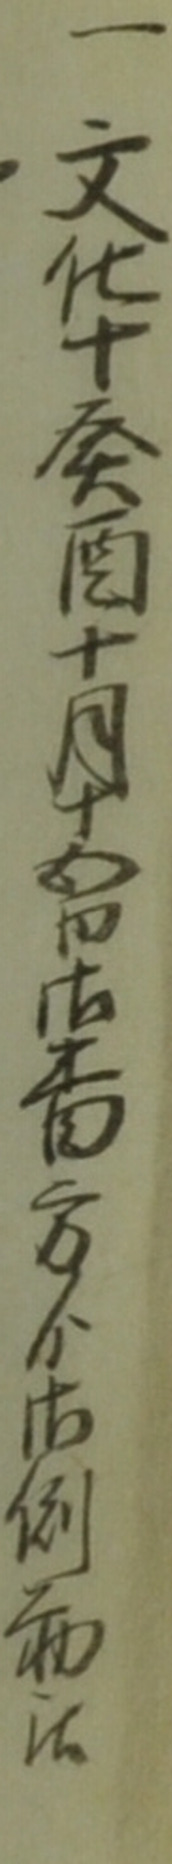一文化癸酉十月十五日御番方ゟ御側勤被
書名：諸御役代々録（五）
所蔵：伊那市立高遠町図書館・合同会社AMANE
